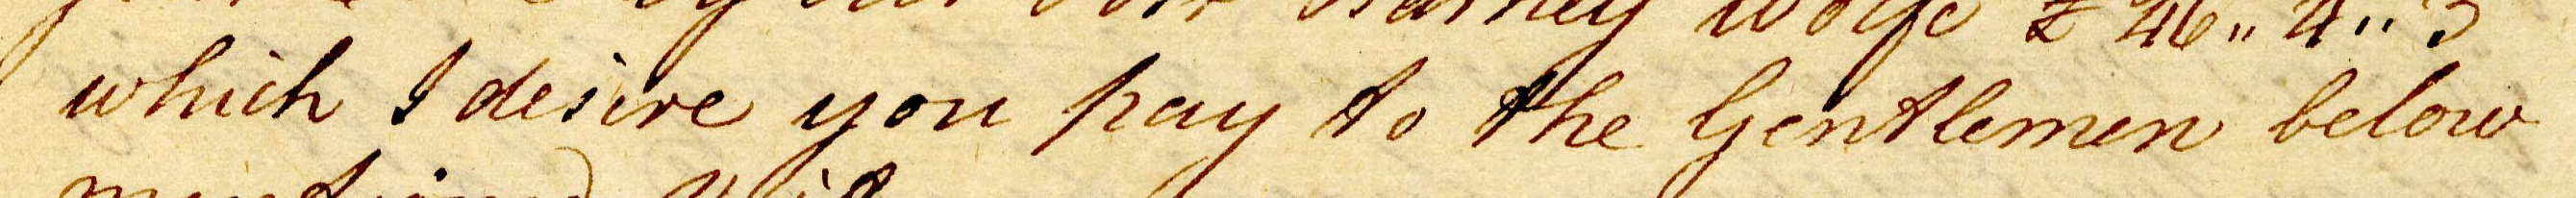which I desire you pay to the Gentlemen below
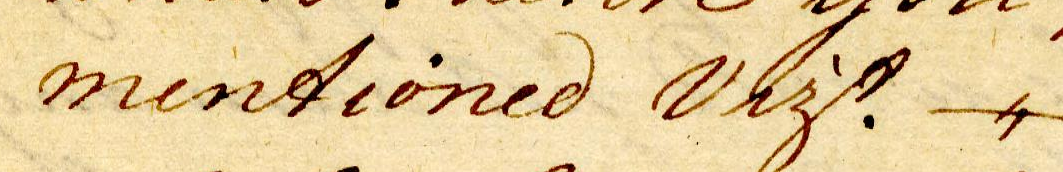mentioned Viz^t.
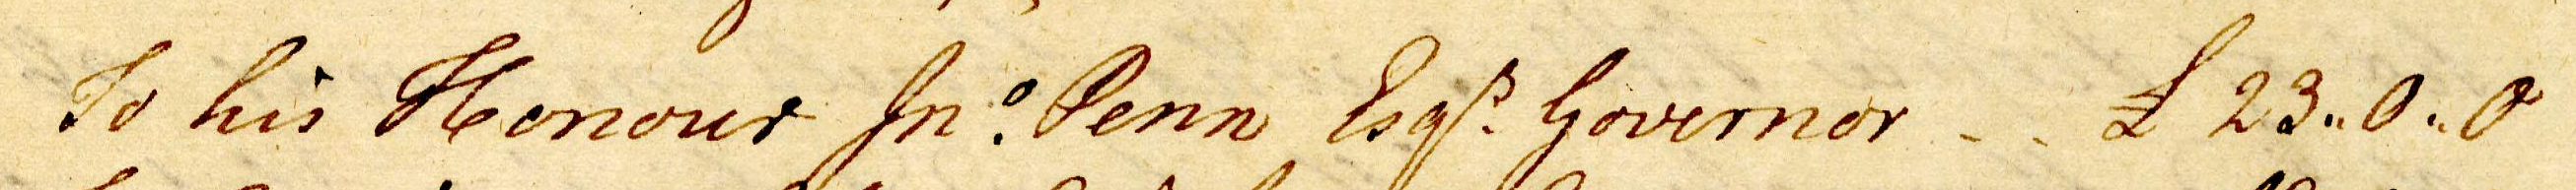To his Honour Jn^o. Penn Esq^r. Governor.. £23..0..0
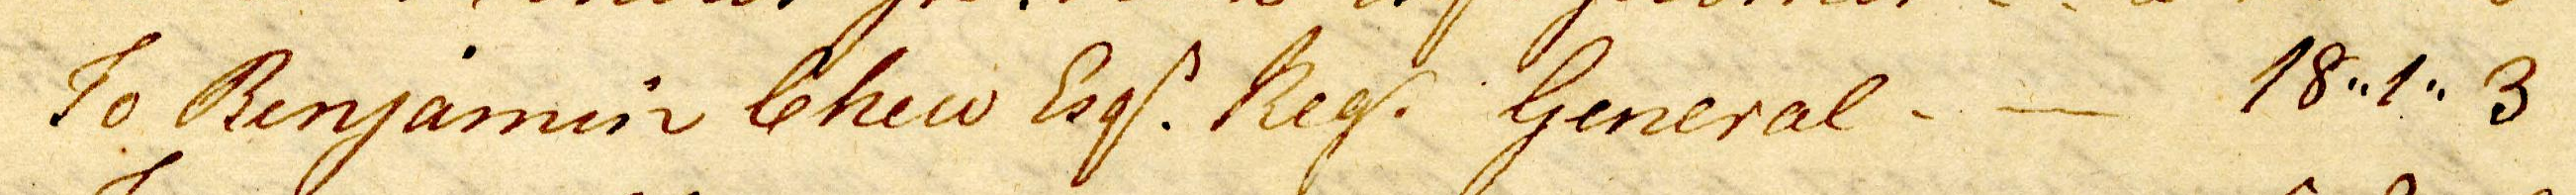to Benjamin Chew Esq^r. Reg. General--18..1..3
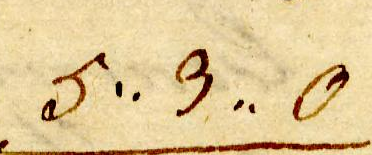5..3..0
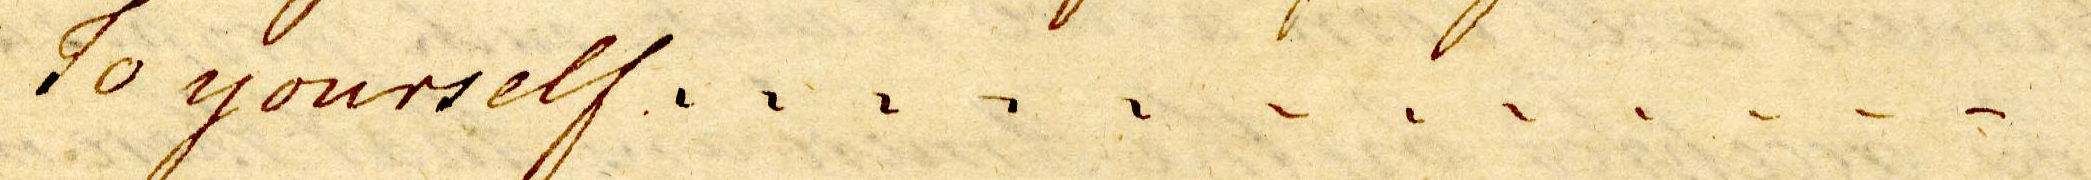To yourself............
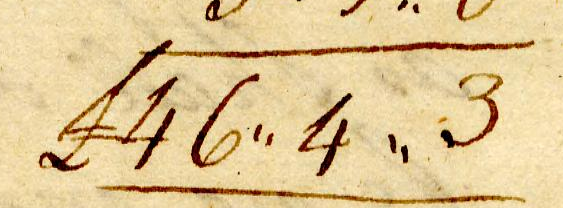£46..4..3
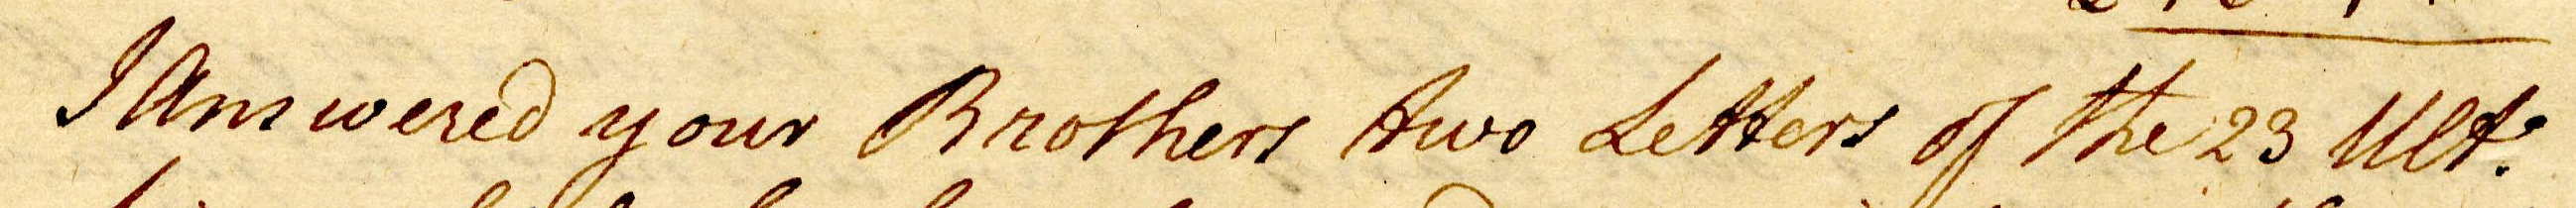I Answered your Brothers two Letters of the 23 Ult.
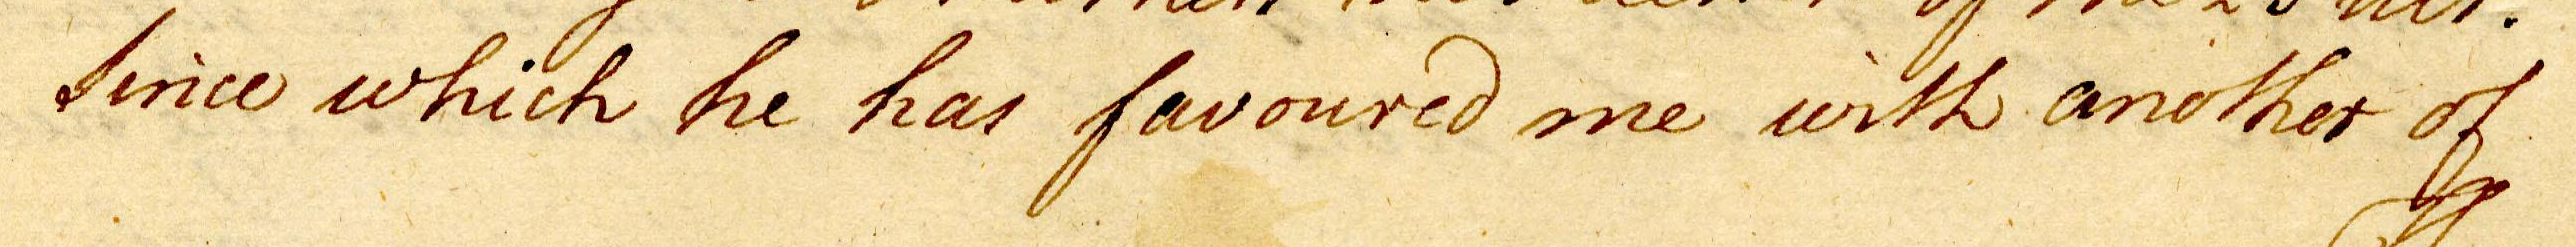since which he has favoured me with another of
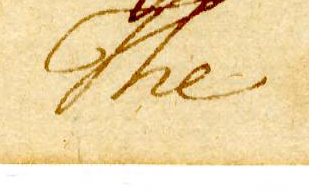the
